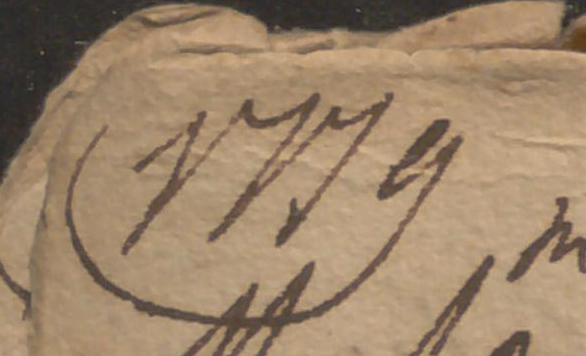1779
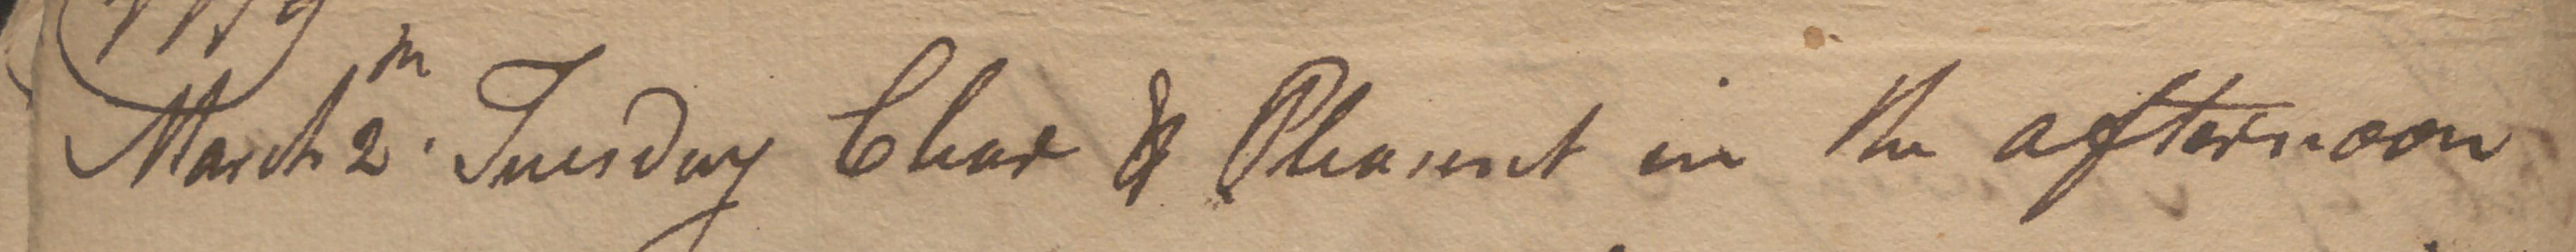March 2^n. Tuesdey Clear & Pleasent in the afternoon
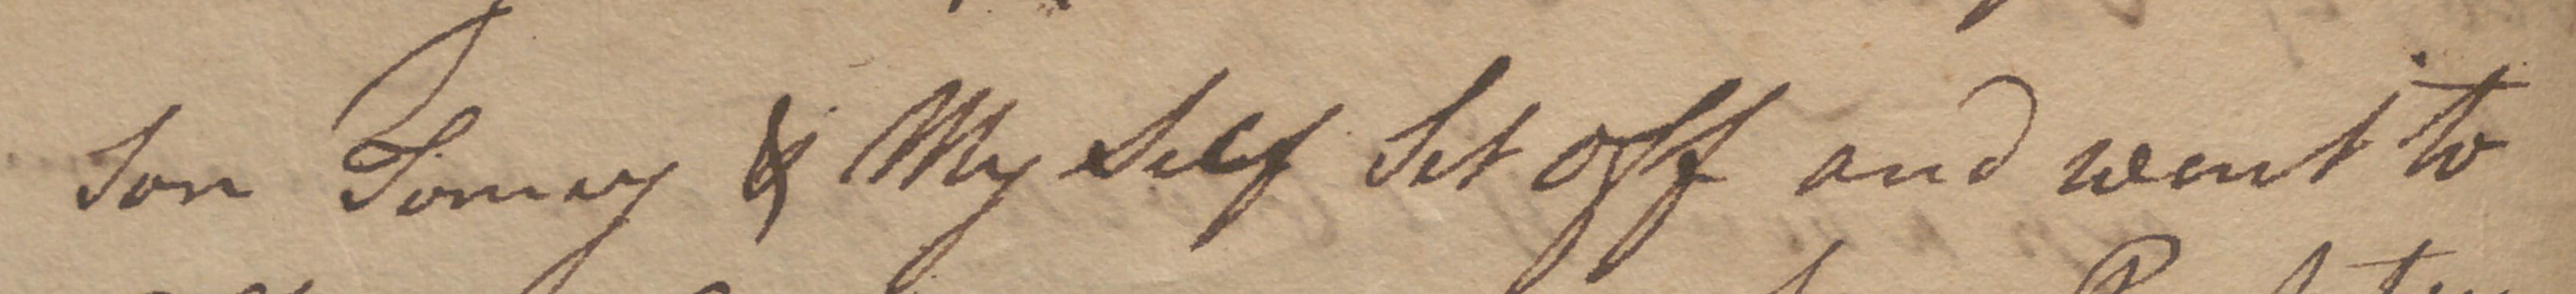Son Tomey & My Self Set off and went to
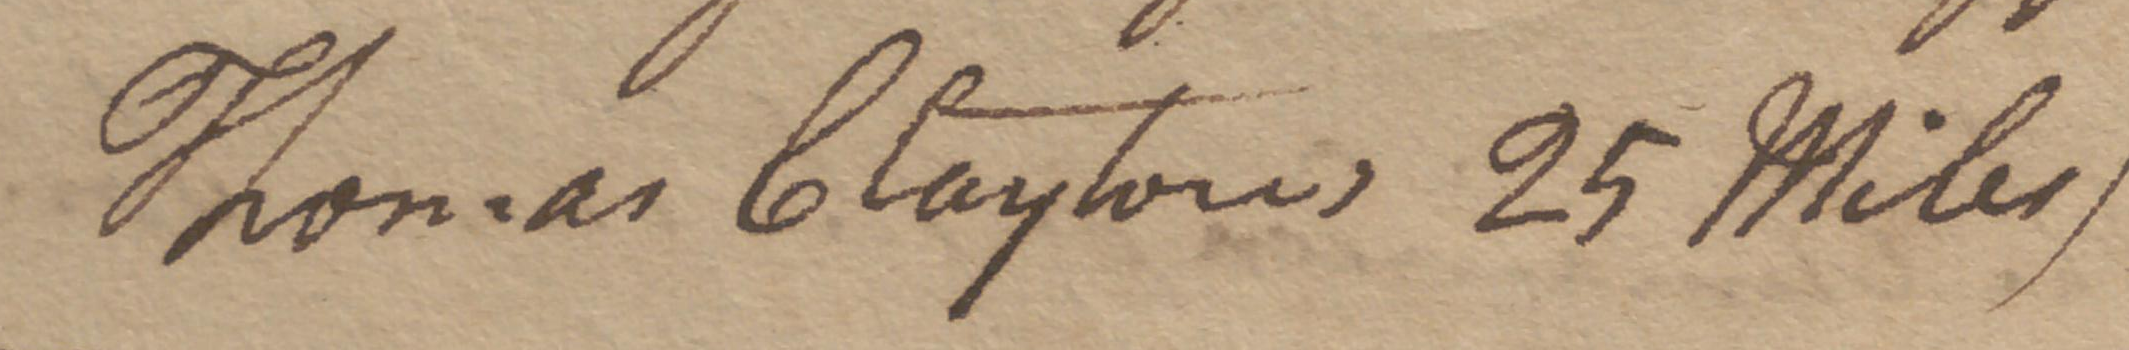Thomas Claytons 25 Miles
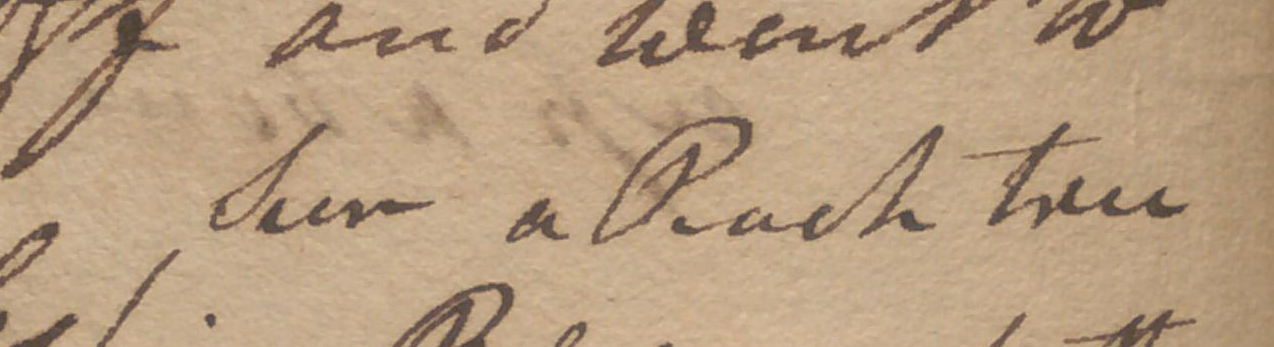Seen a Peach tree
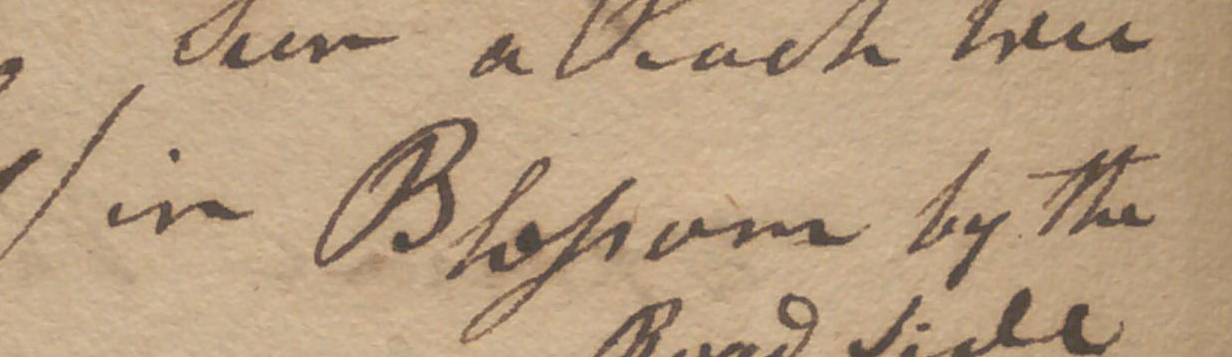in Blossom by the
